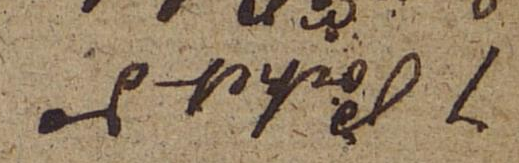7 Pocket d^o
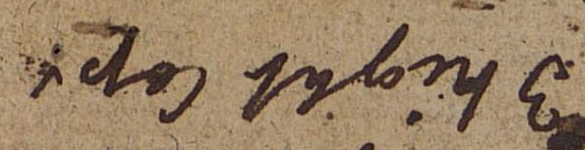3 night Cap^s.
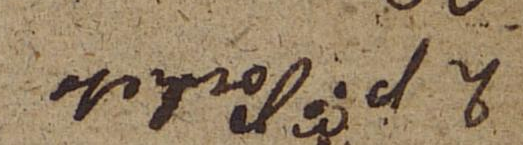2 p^r. Pockets
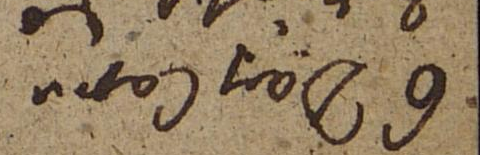6 Day Cars
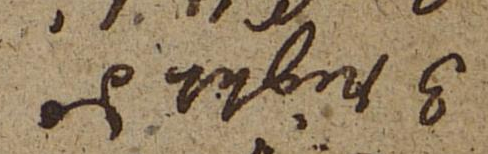3 Nights S
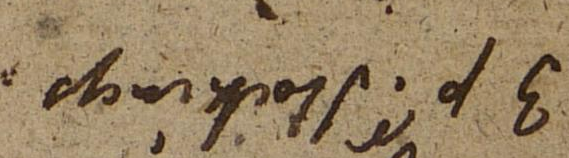3 p^r. Stockings
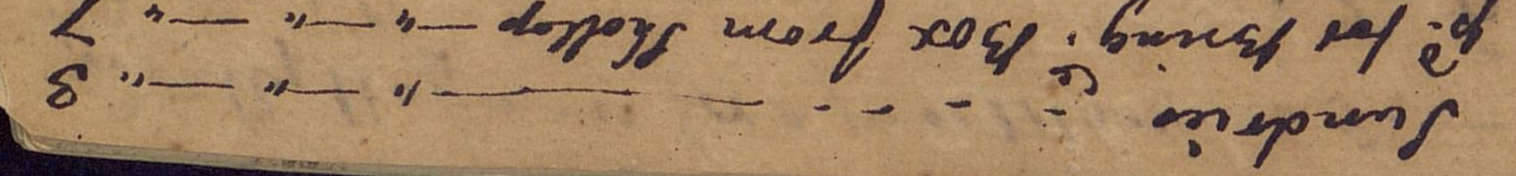Sundries - ..-..-..3
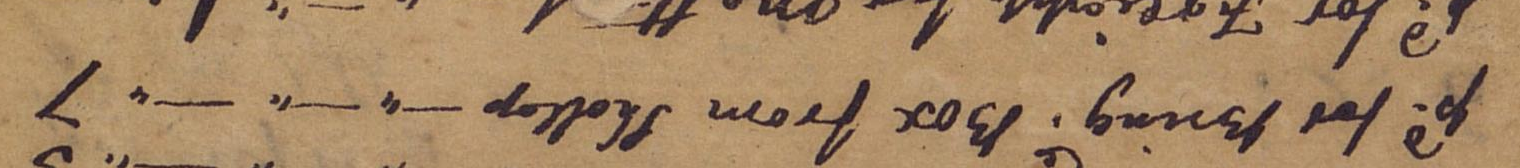p^d. for Bring^g. Box from Shollop-..-..-.. 7
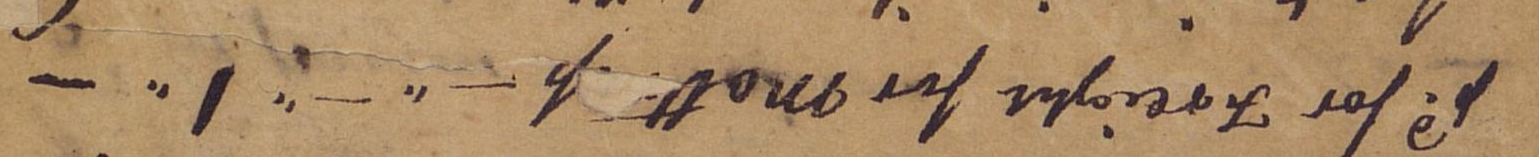p^d. for Freight for Mattress - .. - .. 1 .. -
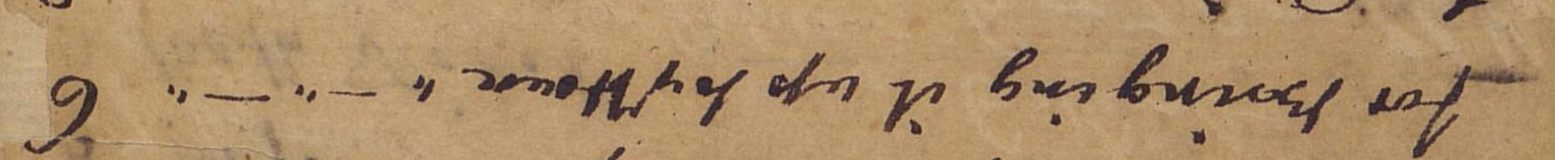for Bringing it up y^e House ..-..-..6
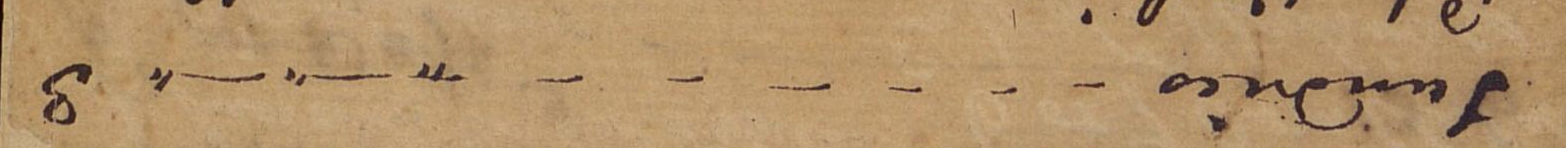Sundries- ..-..-..3
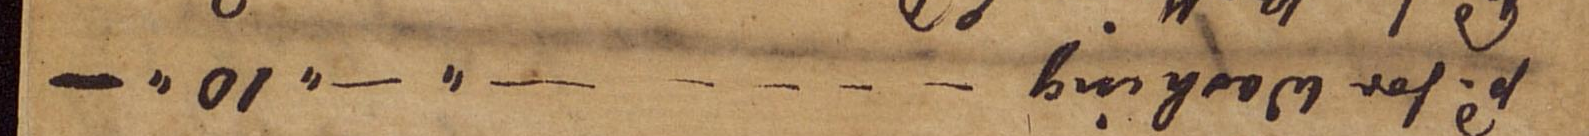p^d. for Washing- -..-..10..-
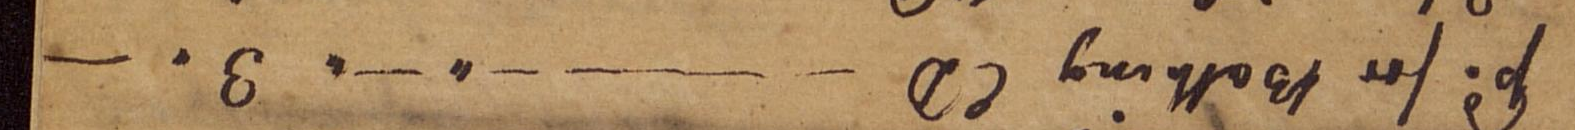p^d. for Bathing ED- ..-..3..-
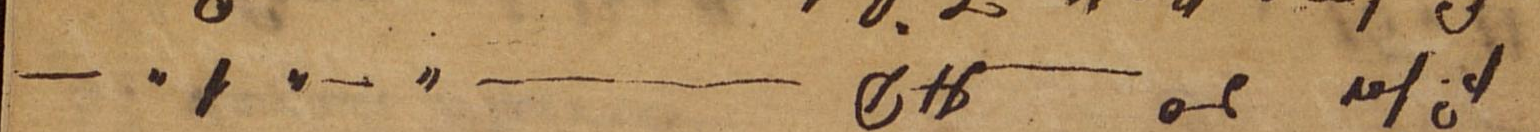p^d. for [d^o]- HD- ..-..1..-
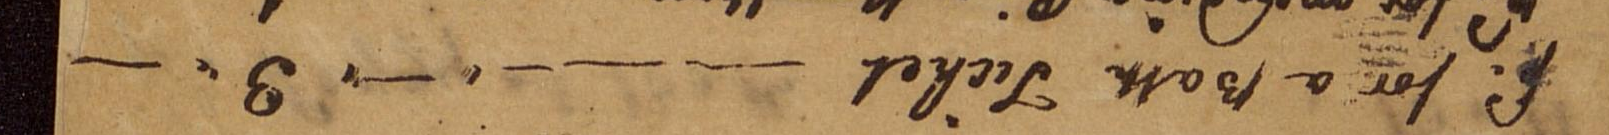p^d. tor a Bath Ticket- ..-..3..-
